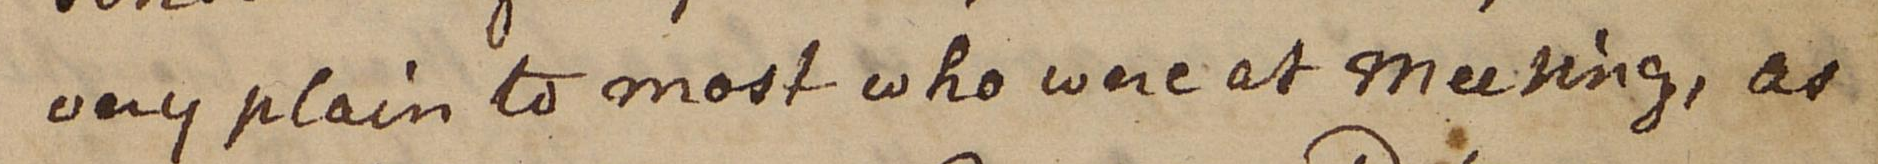very plain to most who were at Meeting, as
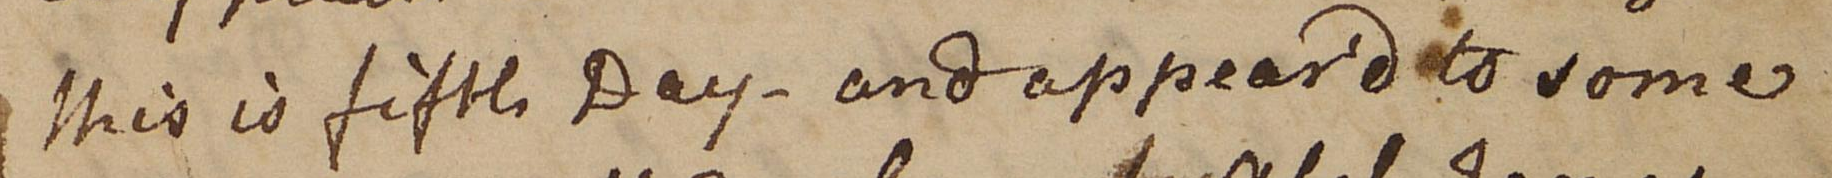this is fifth Day- and appear'd to some
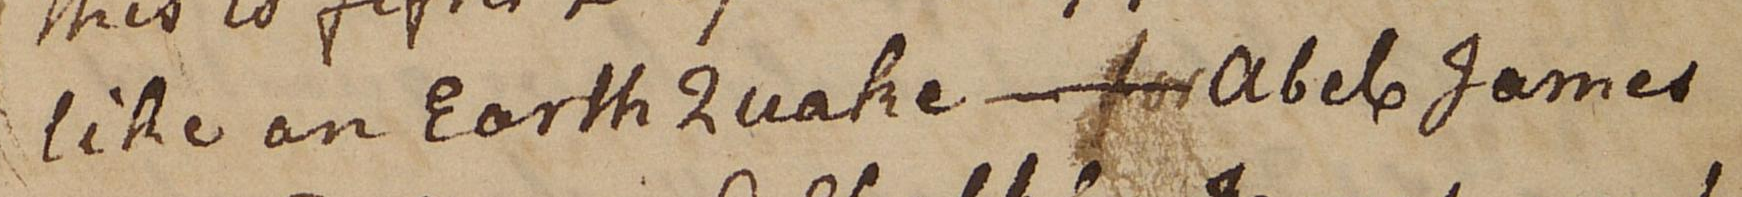like an Earth Quake- Abel James
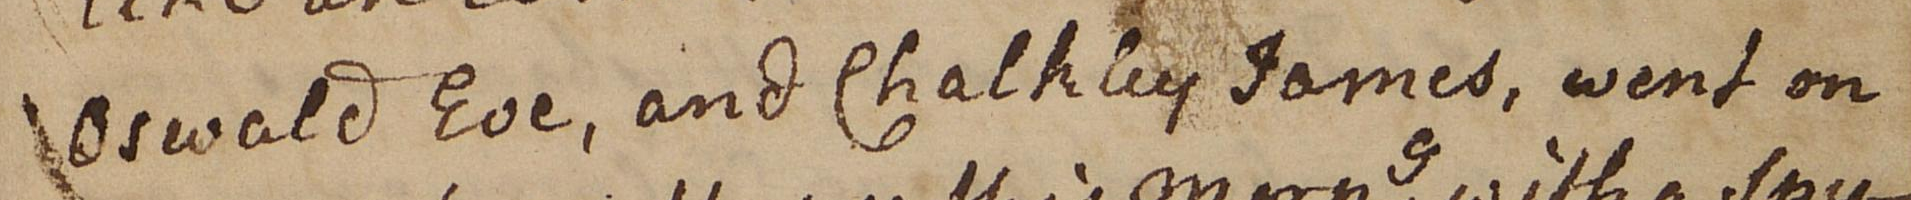Oswald Eve, and Chalkley James, went on
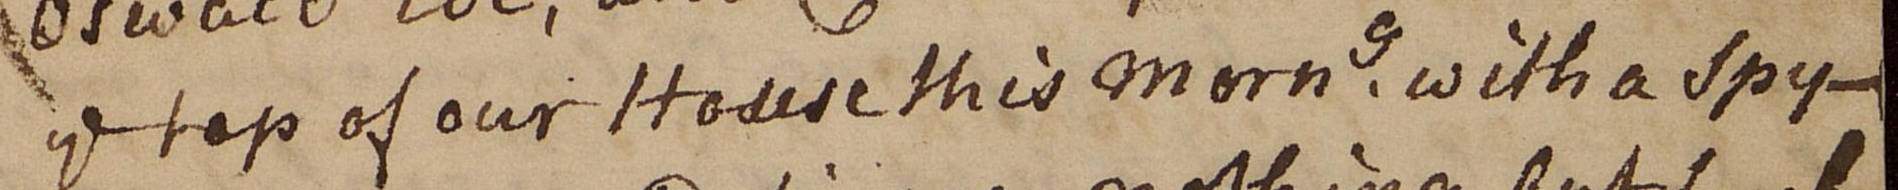y^e top of our House this Morn^g. with a Spy-
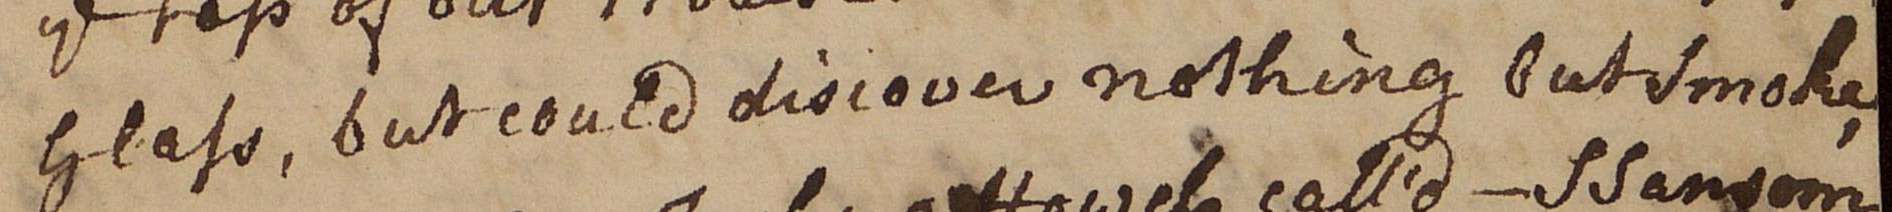Glass, but could discover nothing but Smoke,
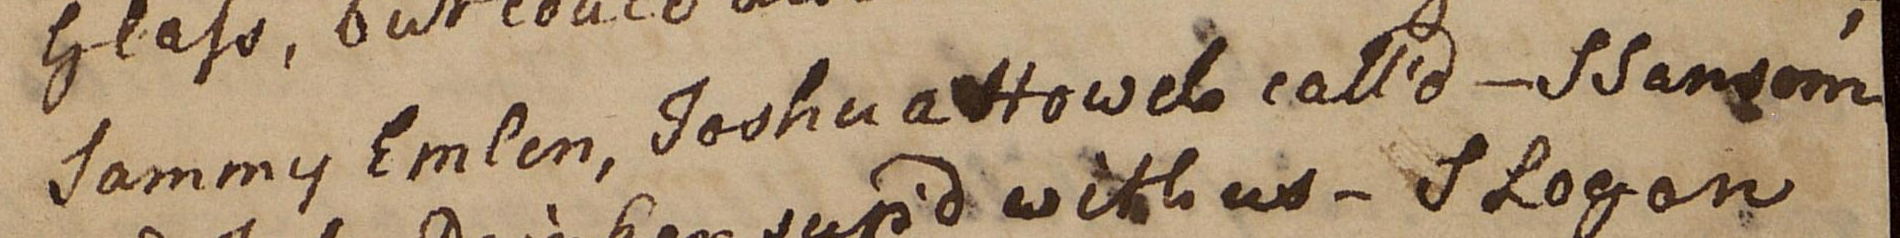Sammy Emlen, Joshua Howel call'd- S Sansom
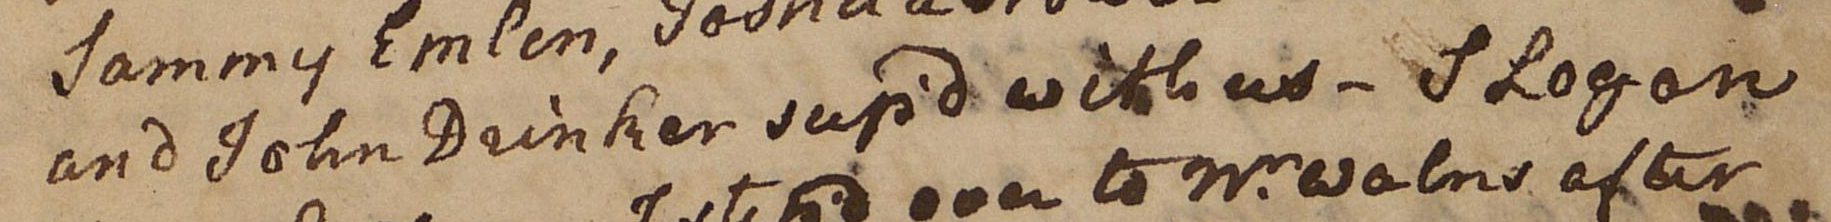and John Drinker sup'd with us- S Logan
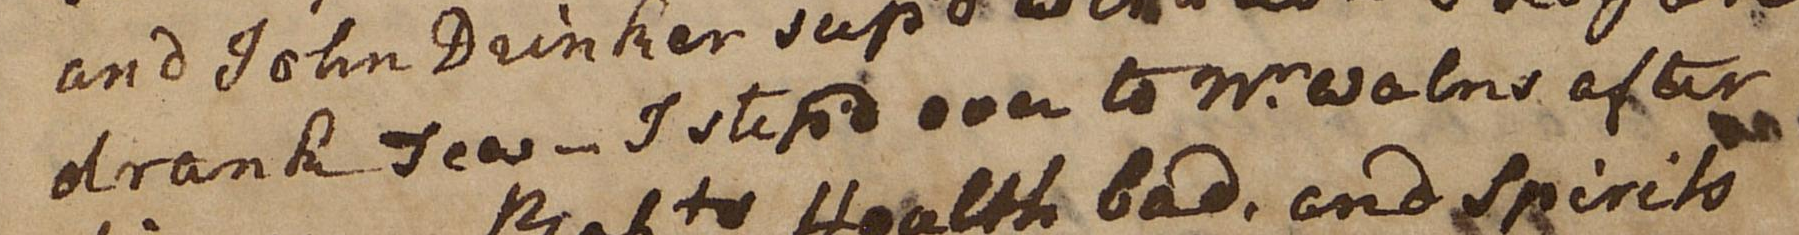drank Tea - I step'd over to W^m. Walns after
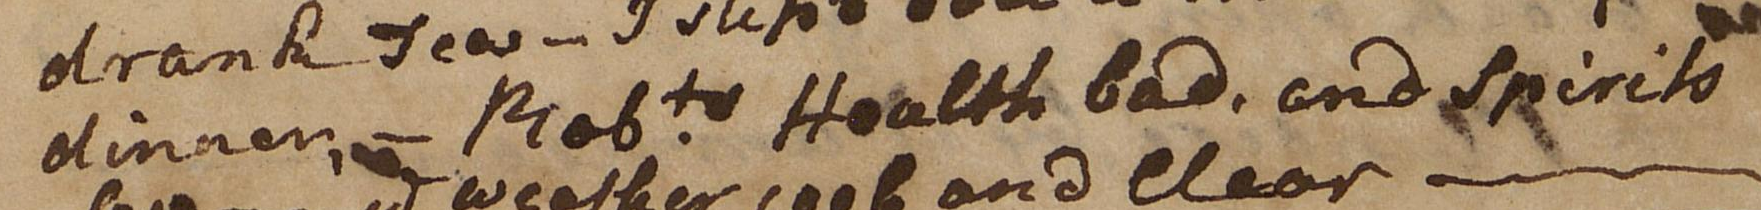dinner, - Rob^t. Health bad, and Spirits
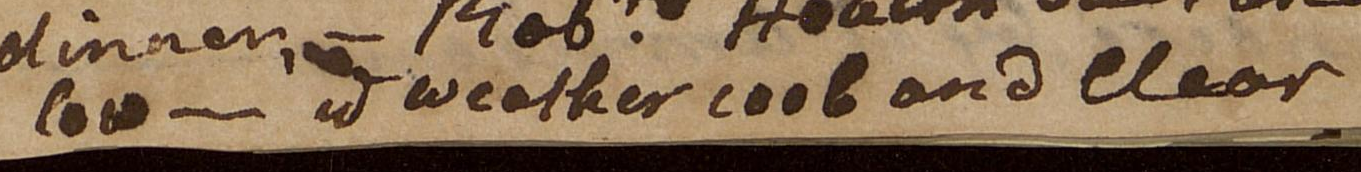low- y^e weather cool and clear
